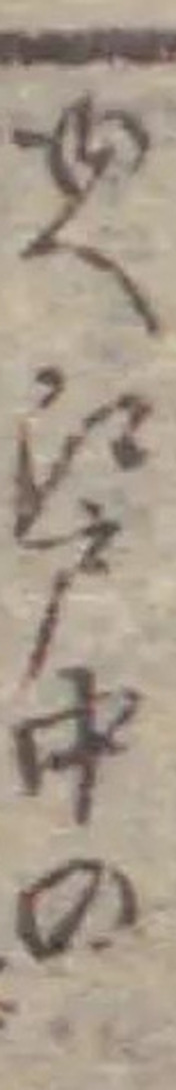ゆへ江戸中の
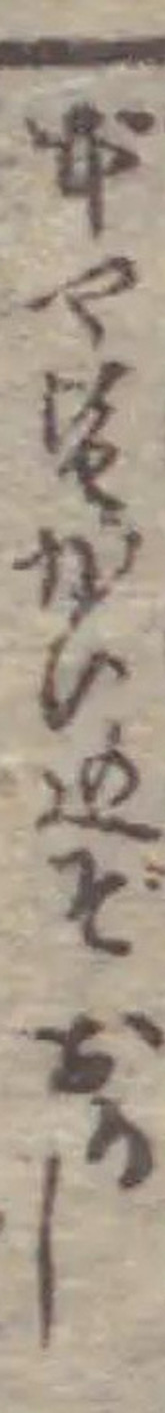本や皆かい込ぞおかし

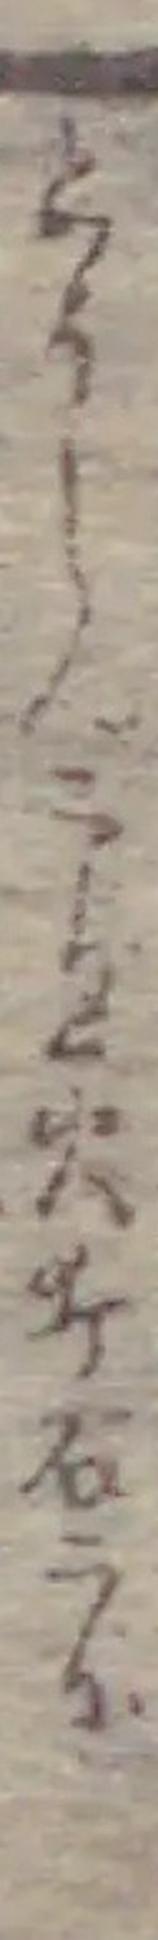とうしん二分火打石二分
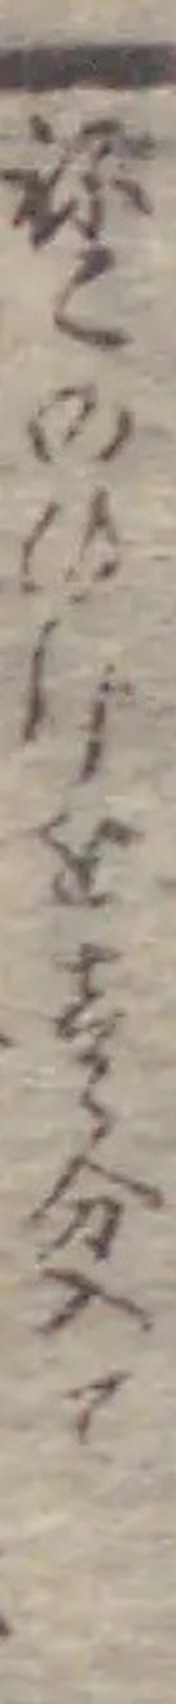ねこのひけを壱分入て
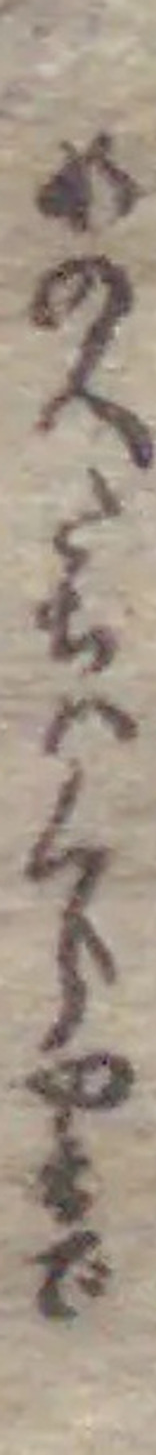あの人たちはくらやみで
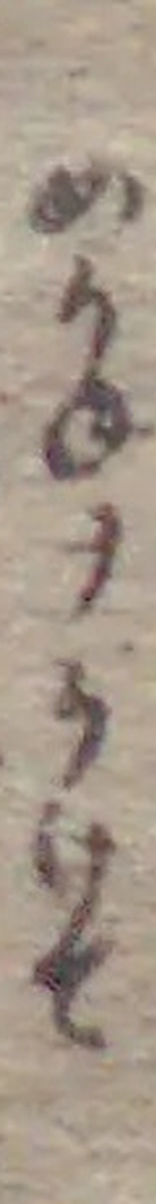めかねヲかけて
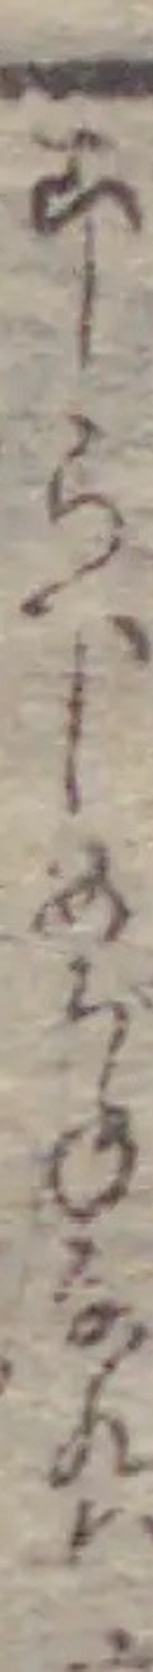こしらへしめがねなれは
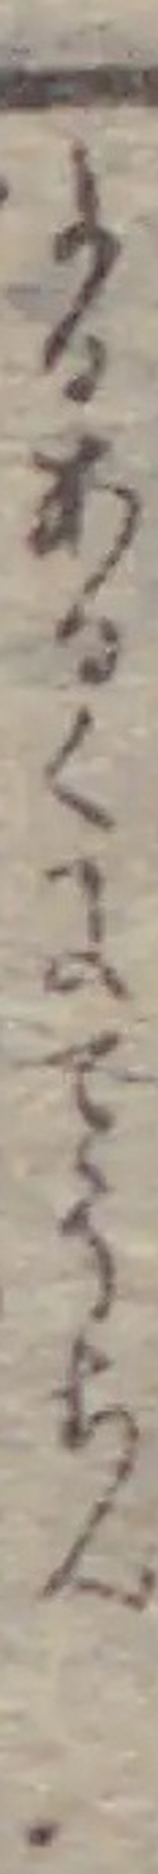よるあるくにてうちん
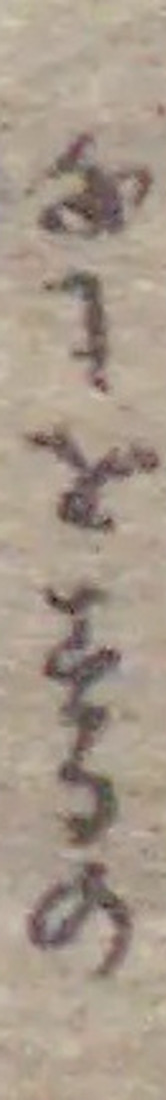なにをするの
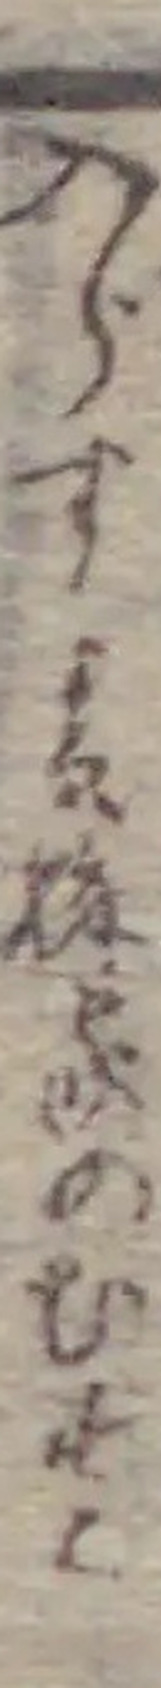入らず麦家のむすこ
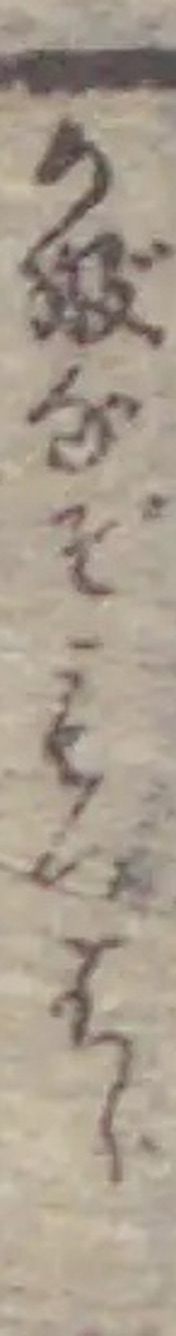かぶなぞもつはら
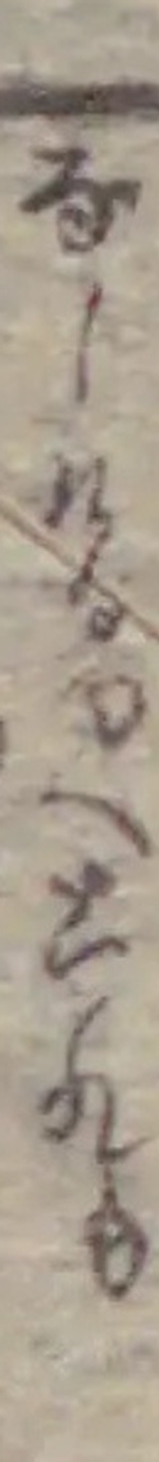なしけるゆへこれも
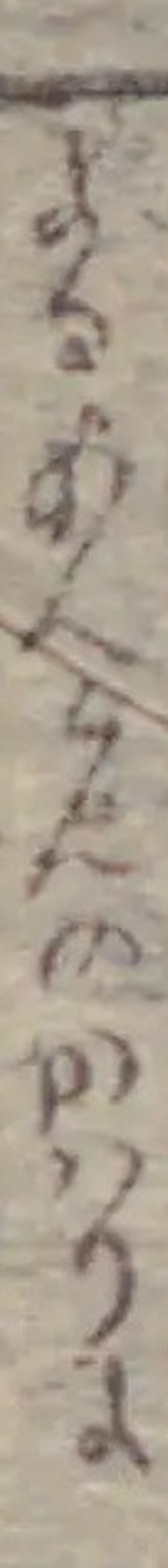よるあんとんのかはりに
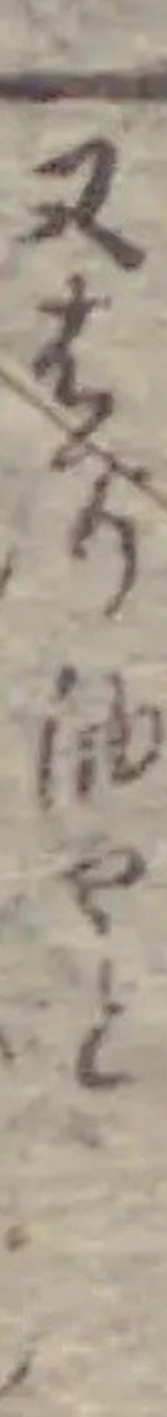又はやり油やと
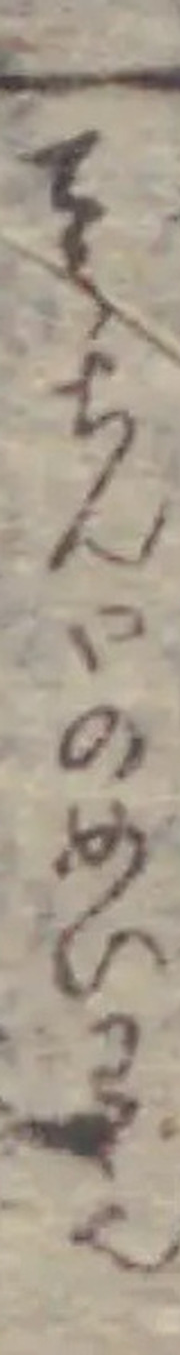てうちんやのめいわく也
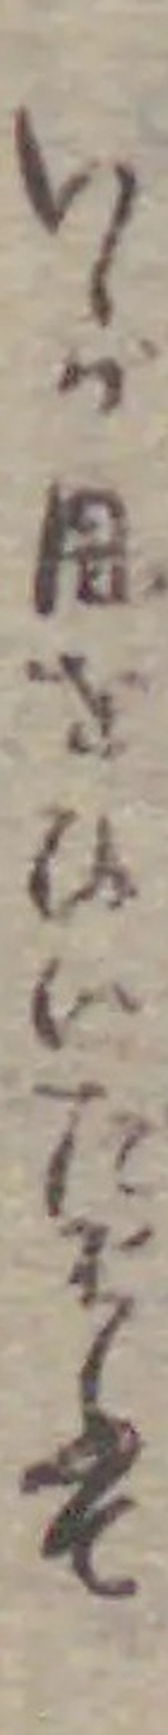いゝが風をひいたふて
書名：栄増眼鏡徳 3巻
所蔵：国立国会図書館 National Diet Library, JAPAN
